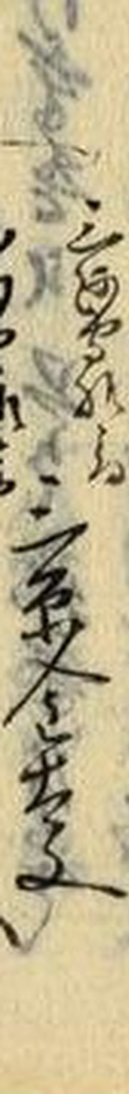三河守様ニ而三原金太夫
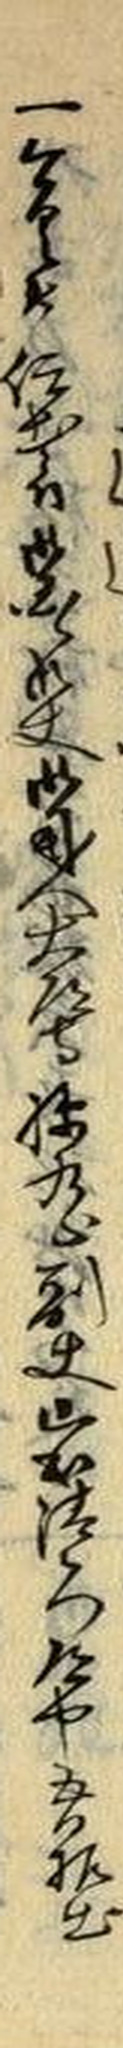一今日之被仰出ニ付御国へ御使御用人大道寺孫九郎副使山本清右衛門道中五日振出
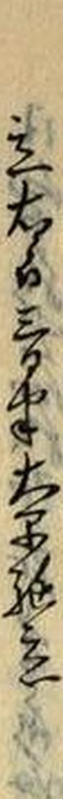立右ニ付三日半大早駆立
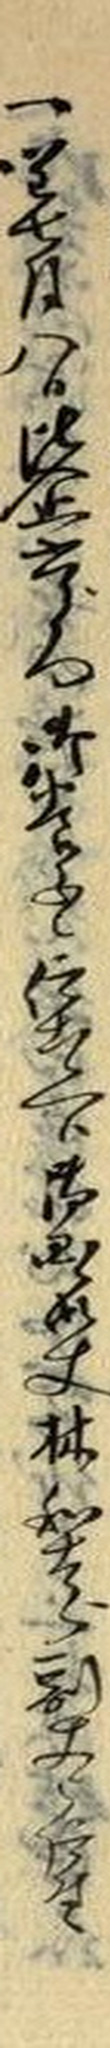一閏七月八日比企六郎右衛門御養子被仰出候へハ御国へ御使林和太郎副使被仰付候
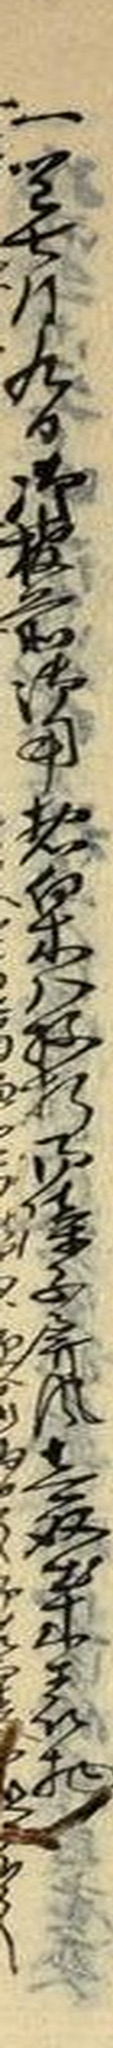一閏七月九日御棺前御用惣白木八枚折御障子屏風壱双出来表物
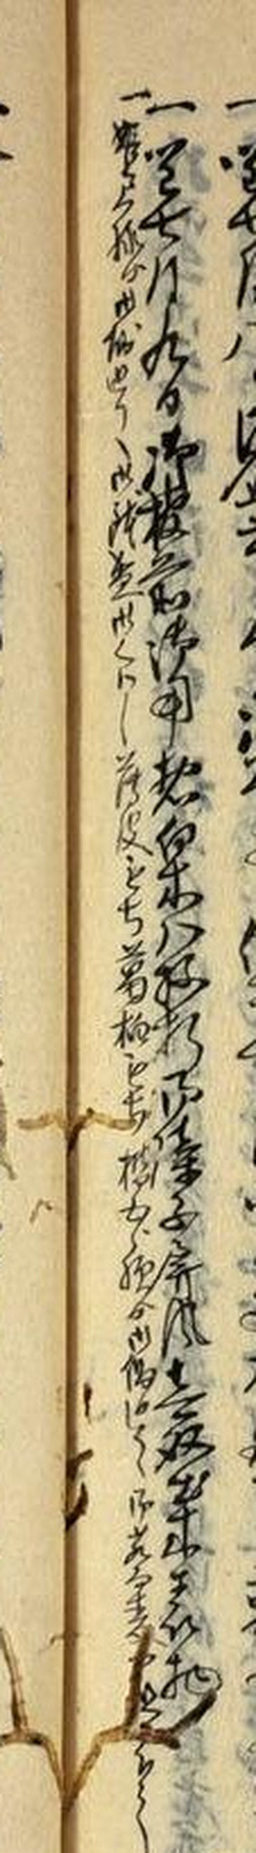一姫君様ゟ御側廻りへ御鉢盛御くハし薄皮もち葛柏もち楷五郎様ゟ御側廻りへ御蕎麦壱組被下之
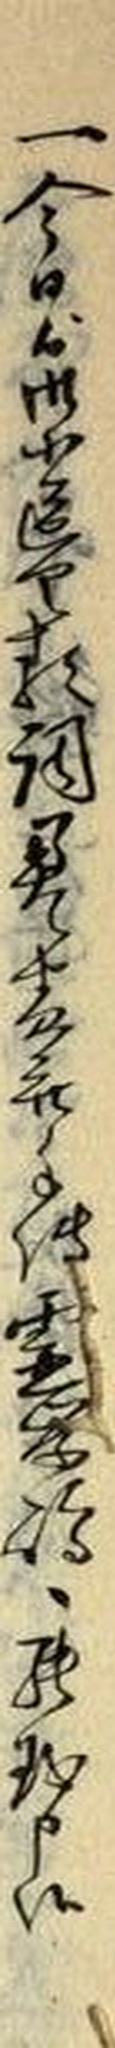一今日ゟ御小道具類調奥之番并手伝霊岸嶋へ罷越申候
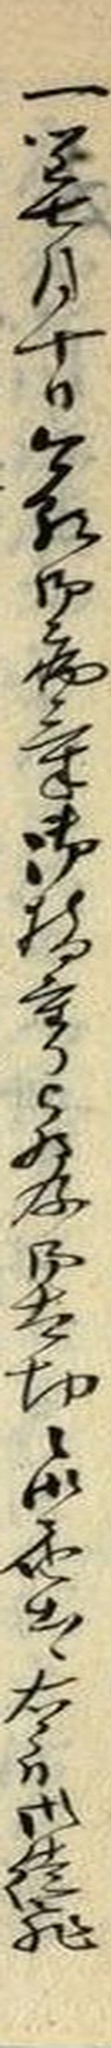一閏七月十日今朝御病気御指重り被為及御大切之御届出候右ニ付御徒飛
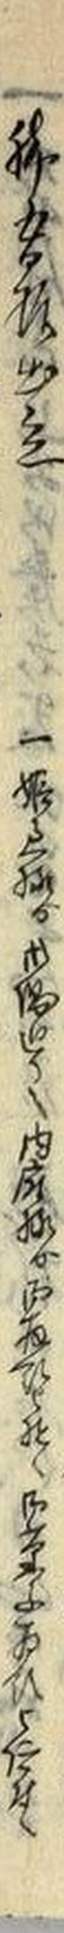脚五日振出立一姫君様ゟ御側廻りへ内府様ゟ御拝領被遊候御菓子拝領被仰付候
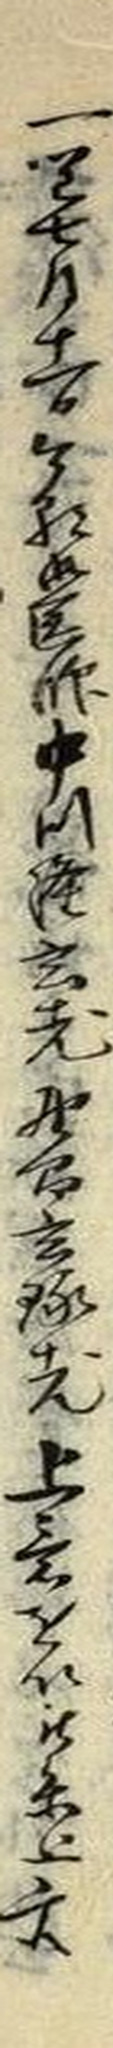一閏七月十一日今朝御医師中川隆玄老野間玄瑑老上意を以被参上最
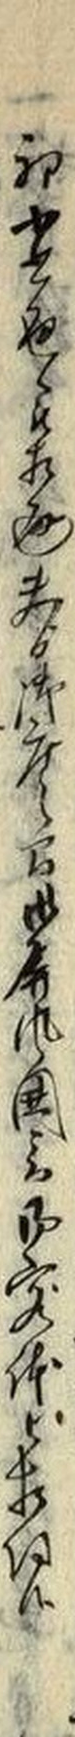初小書通へ被相通夫ゟ御座之間御屏風囲ニ而御容体被相伺候
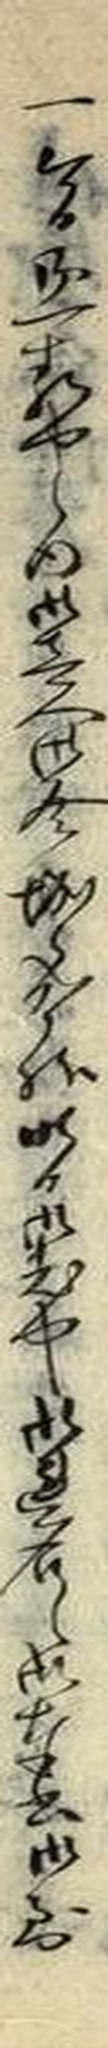一今日御一類中之内御壱人御登城被成候様昨日御老中御達有之御奉書御到
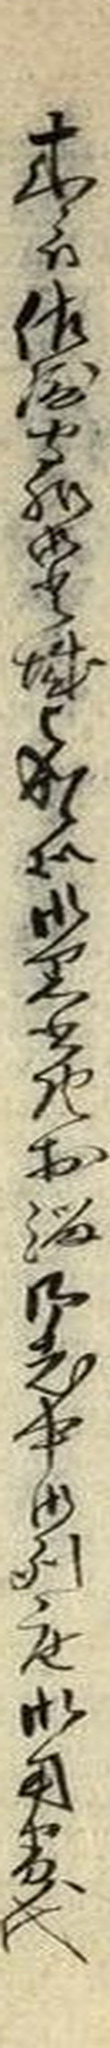来ニ付佐渡守様御登城被成候処御黒書院於溜御老中御列座御用番代
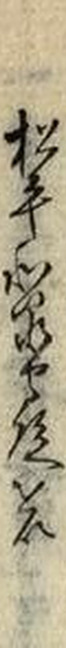松平和泉守殿を以
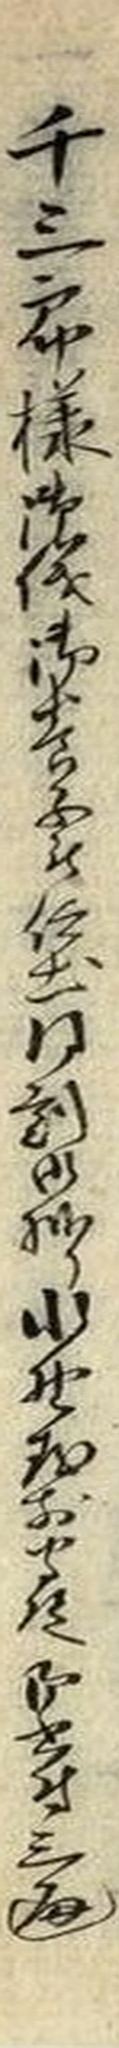千三郎様御儀御養子被仰出同刻御掛り水野越前守殿へ御書付三通
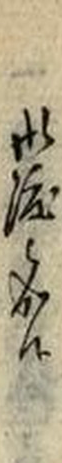御渡被成候
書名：少傅日録抄（斉承付側向頭取日記、在府）
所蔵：福井県文書館 Fukui Prefectural Archives
